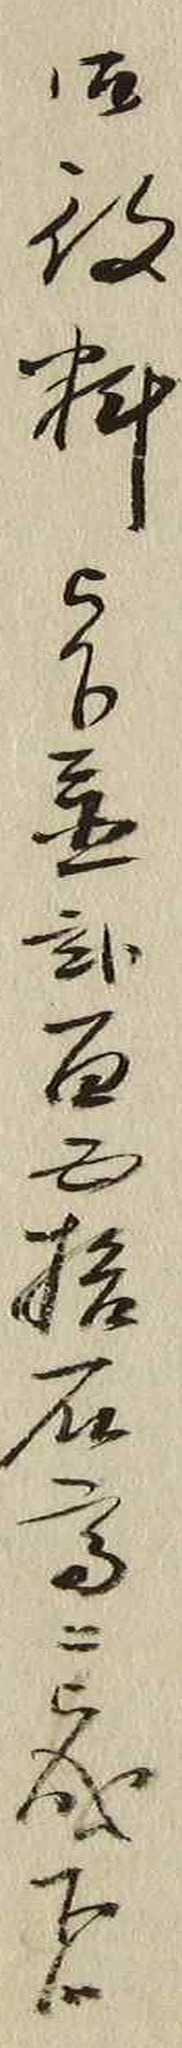御役料被下置弐百五拾石高ニ被成下候
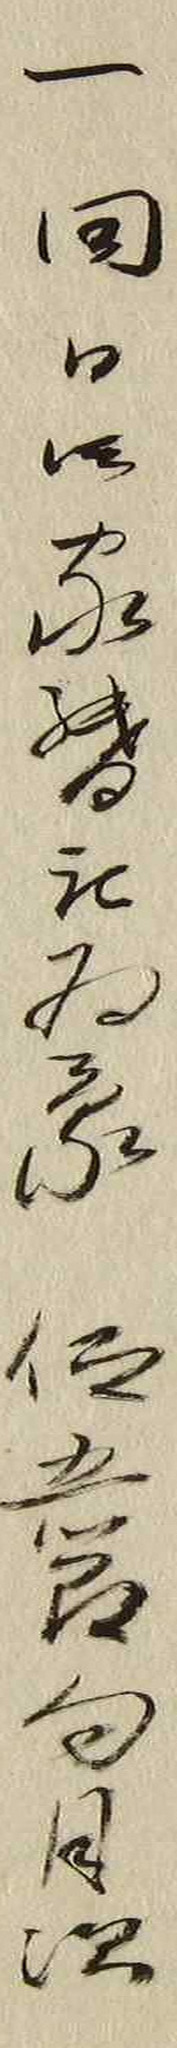一同日御家督被為蒙仰五節句月次
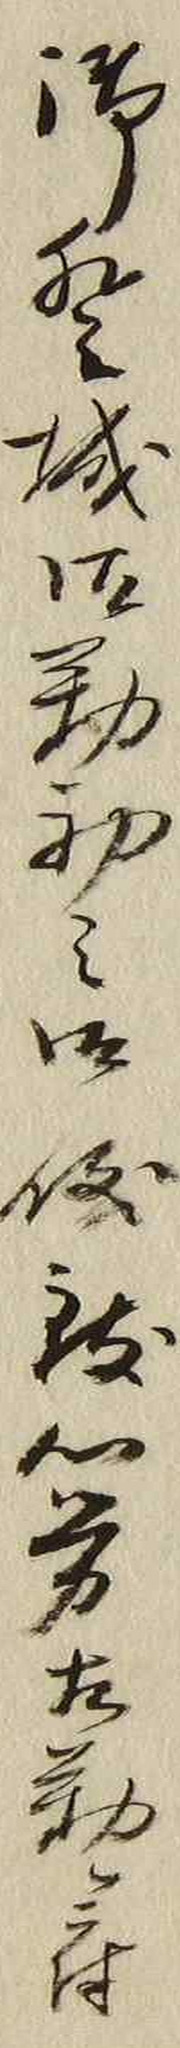御登城御勤初之御儀致心労相勤候ニ付
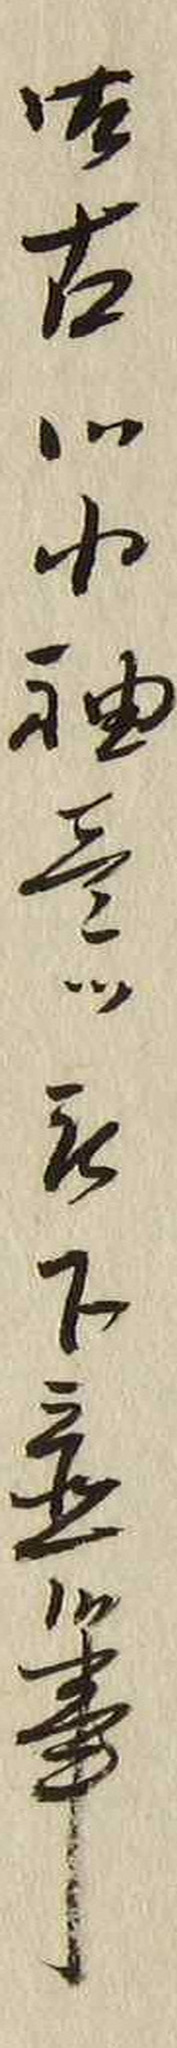御古御小袖壱ツ被下置候事

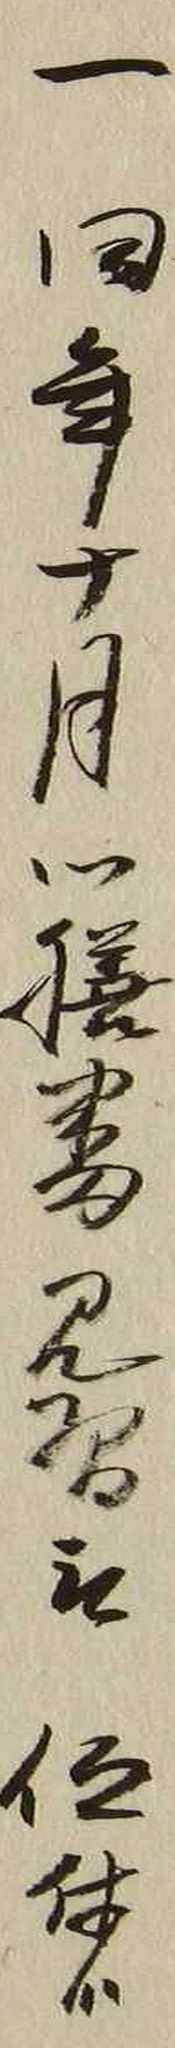一同年十月御膳番見習被仰付候
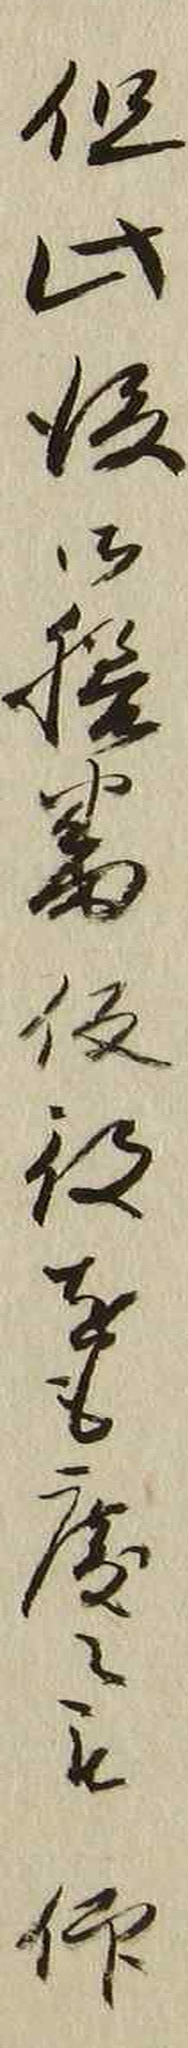但此後御膳番仮役をも度々被仰
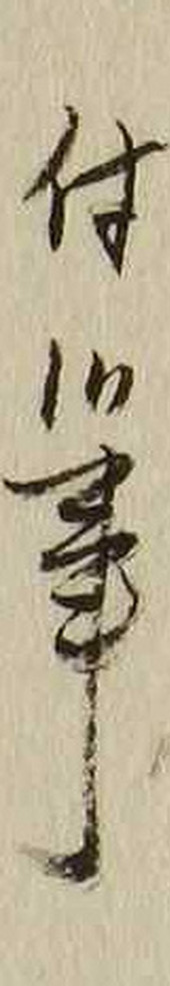付候事
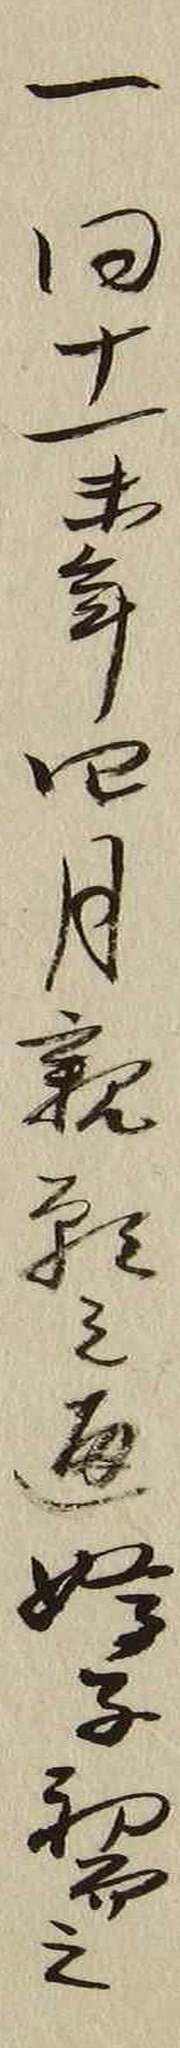一同十一未年四月親願之通嫡子初而之
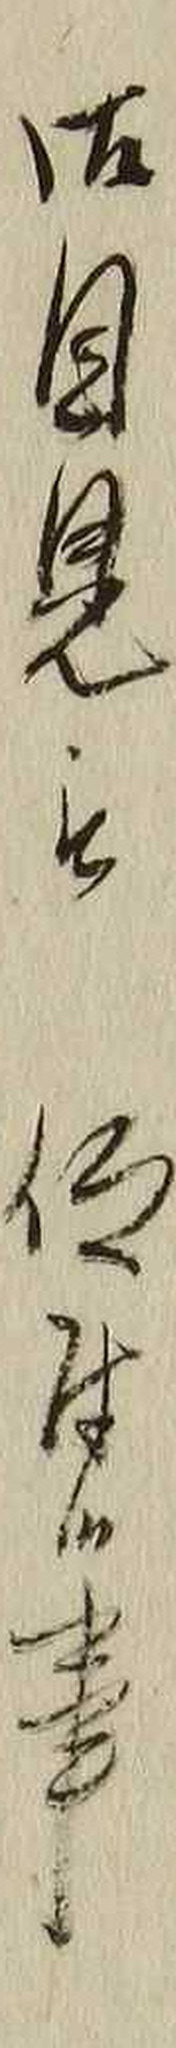御目見被仰付候事
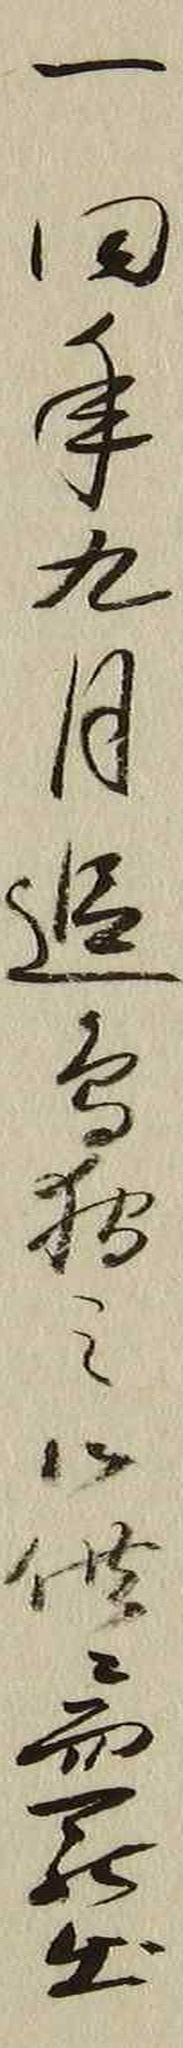一同年九月追鳥狩之御供ニ而罷出
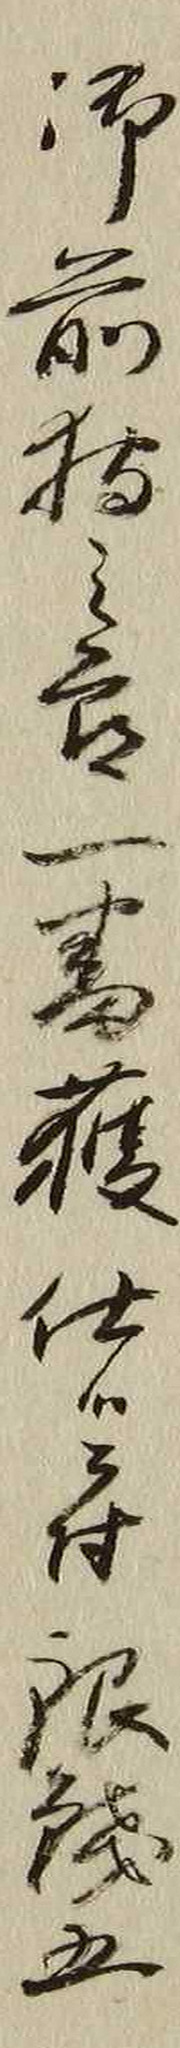御前狩之節一番獲仕候ニ付銀銭五
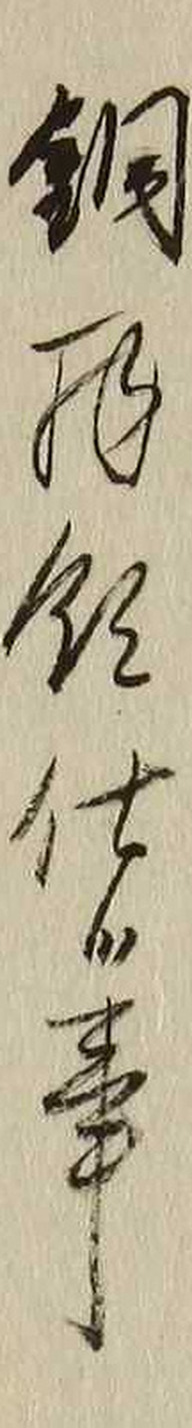銅拝領仕候事
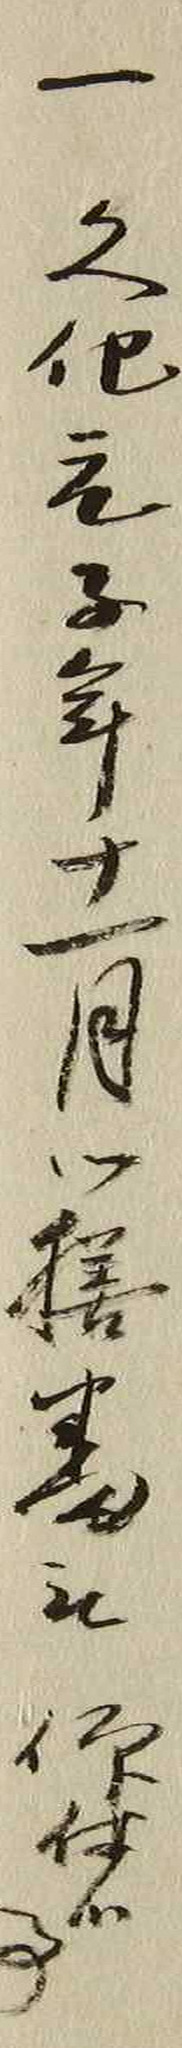一文化元子年十一月御膳番被仰付候事
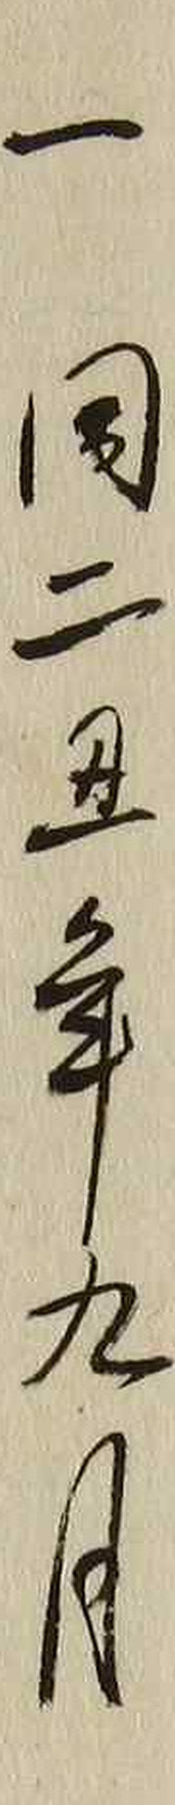一同二丑年九月
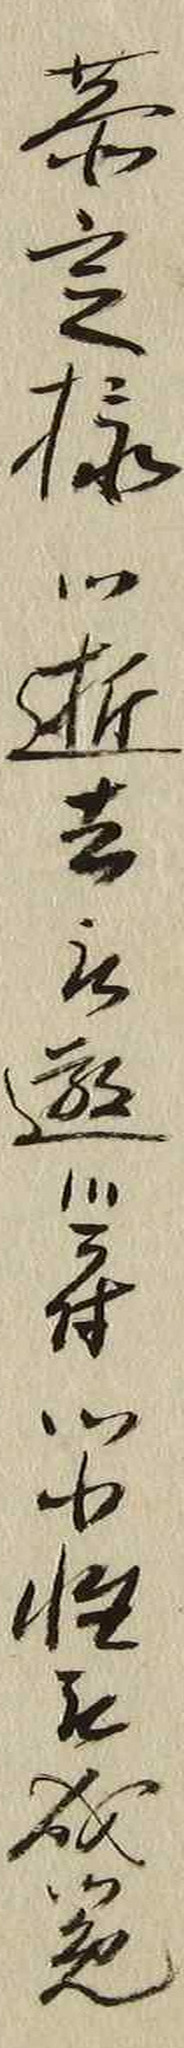恭定様御逝去被遊候ニ付御小性被成御免
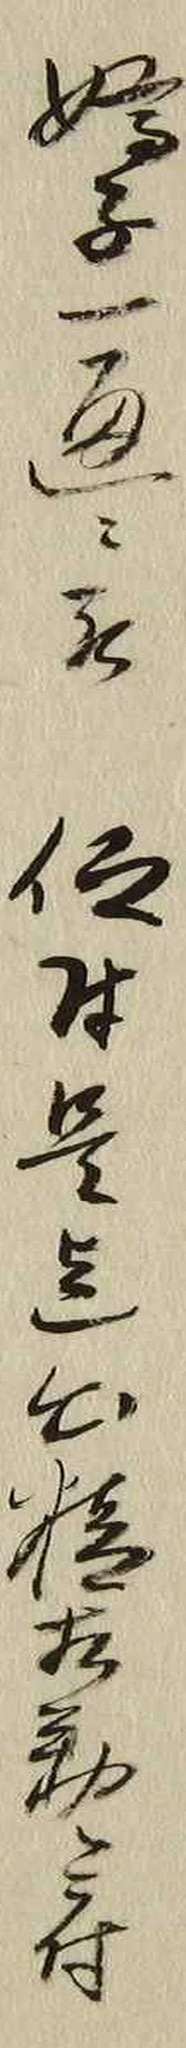嫡子一通ニ被仰付是迄出精相勤候ニ付
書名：諸士系譜　巻之345　も之部1
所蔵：会津若松市立会津図書館
